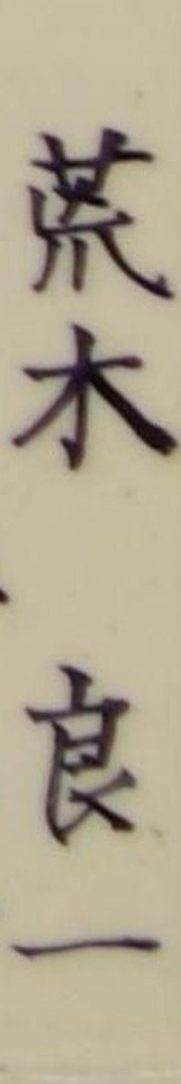荒木良一
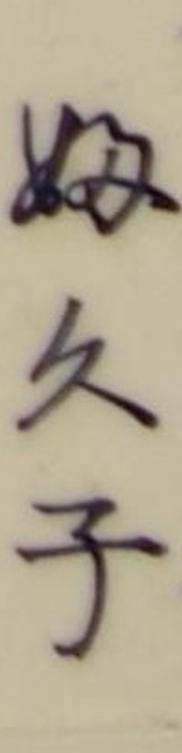ふ久子
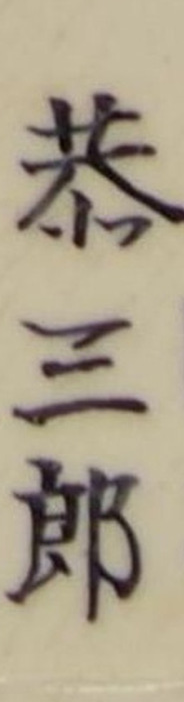恭三郎
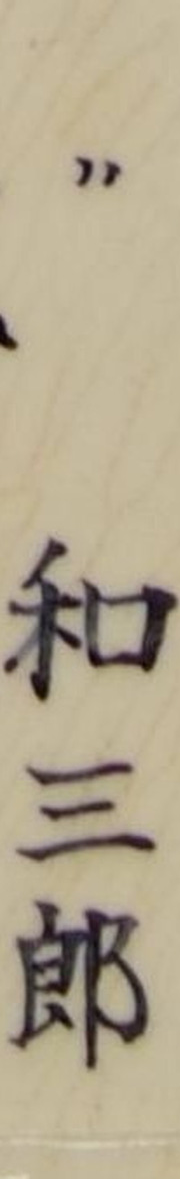和三郎
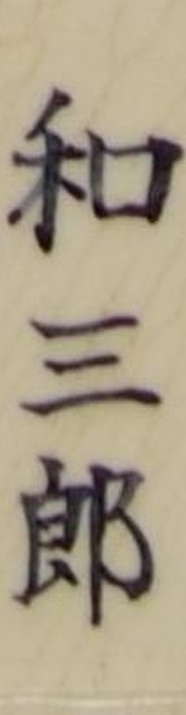和三郎
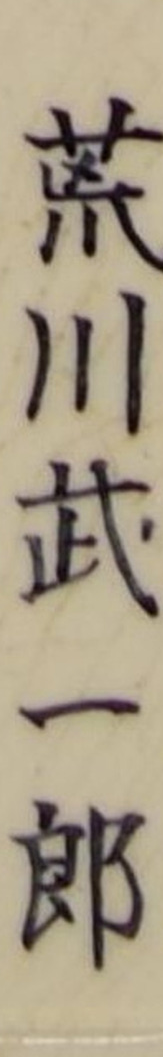荒川武一郎
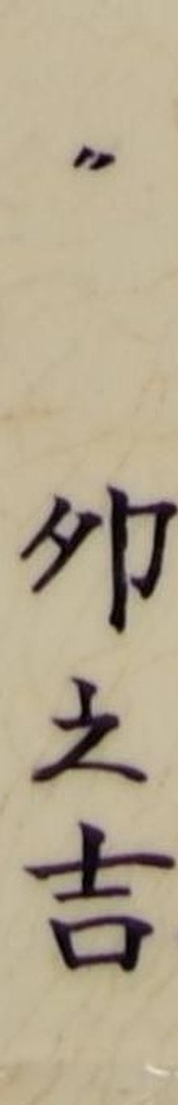卯之吉
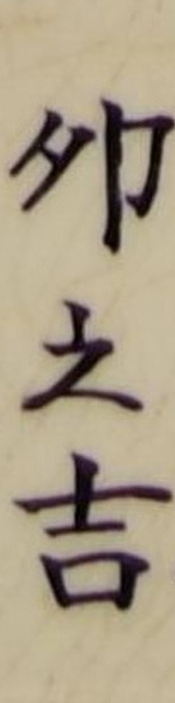卯之吉
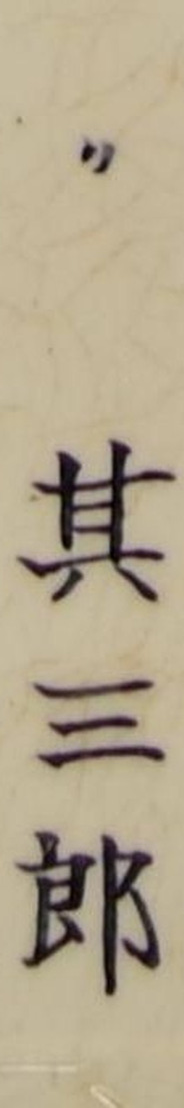恭三郎
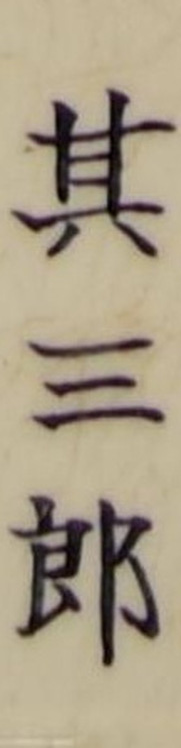其三郎
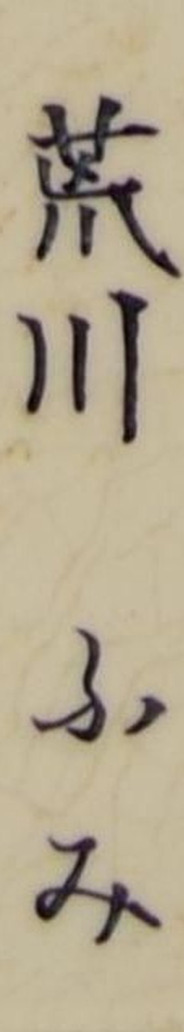荒川ふみ
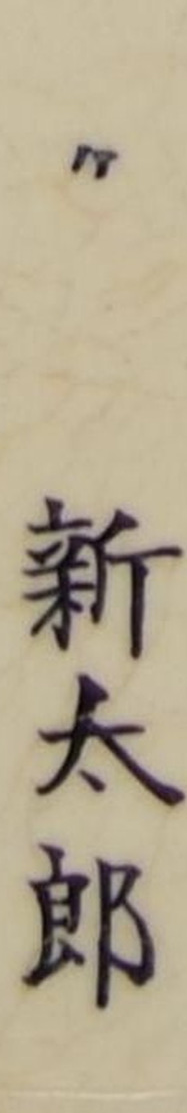新太郎
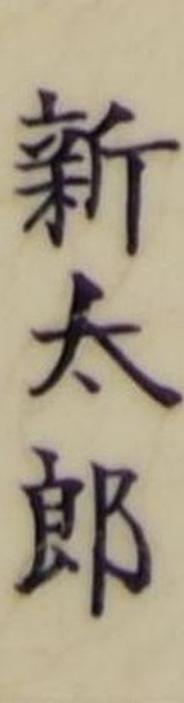新太郎

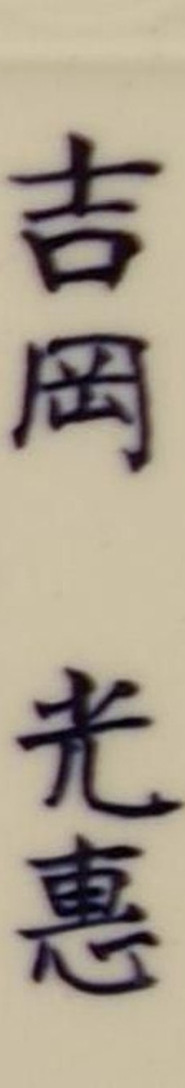吉岡光恵
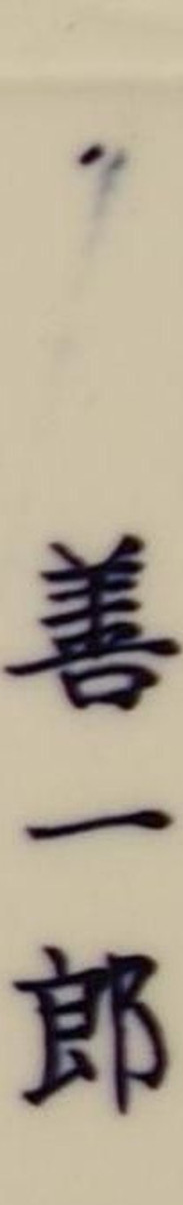善一郎
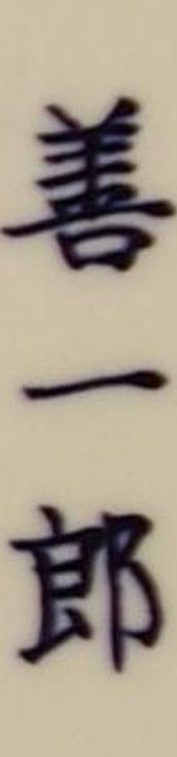善一郎
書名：A~D
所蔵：koyasan kongobuji
